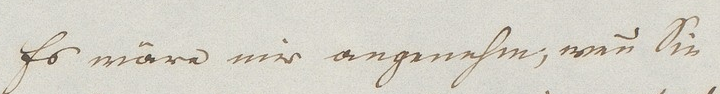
Es wäre mir angenehm, wenn Sie
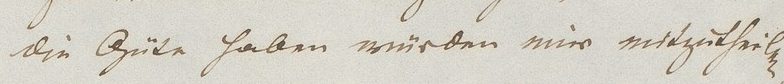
die Güte haben würden mir mitzutheilen,
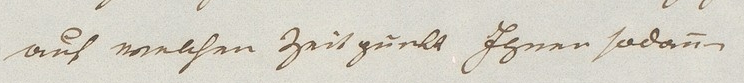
auf welchen Zeitpunkt Ihnen sodann
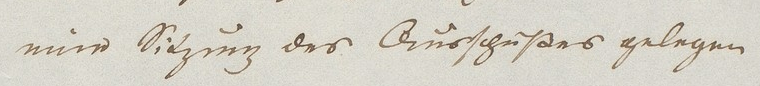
eine Sitzung des Ausschußes gelegen
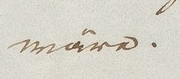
wäre.
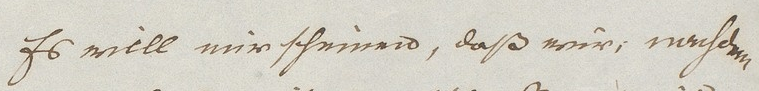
Es will mir scheinen, daß wir, nachdem
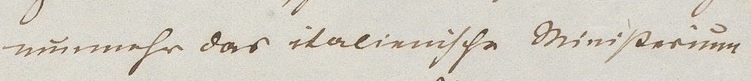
nunmehr das italienische Ministerium
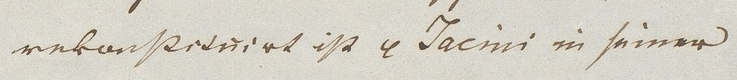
rekonstituirt ist & Jacini in seiner
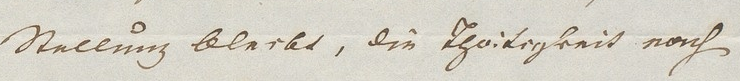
Stellung bleibt, die Thätigkeit nach
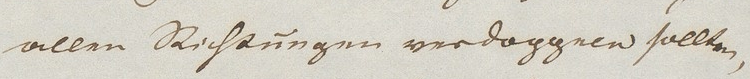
allen Richtungen verdoppeln sollten,
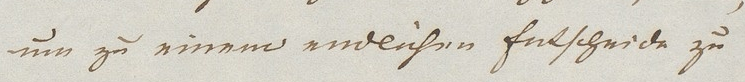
um zu einem endlichen Entscheide zu
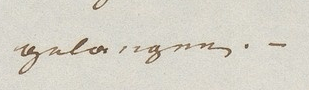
gelangen. –
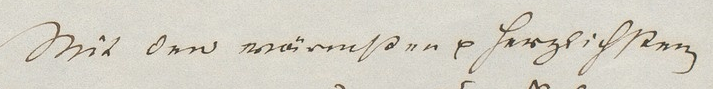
Mit den wärmsten & herzlichsten
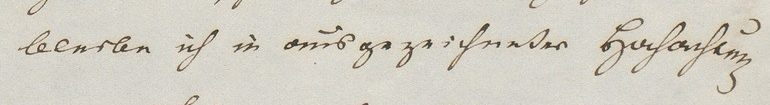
bleibe ich in ausgezeichneter Hochachtung
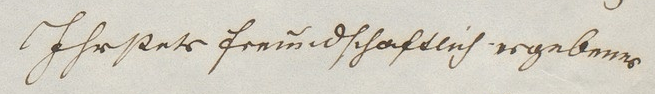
Ihr stets freundschaftlich ergebener
